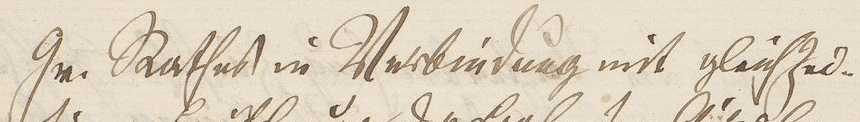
Gr. Rathes in Verbindung mit gleichzei-
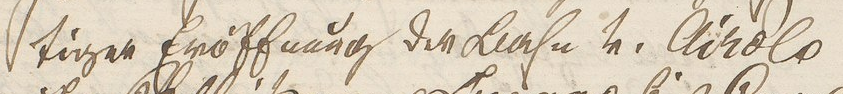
tiger Eröffnung der Bahn v. Airolo
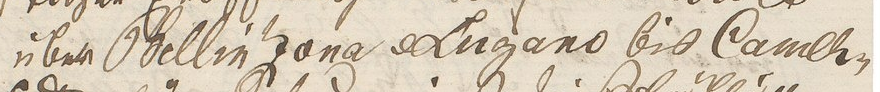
über Bellinzona & Lugano bis Camer-
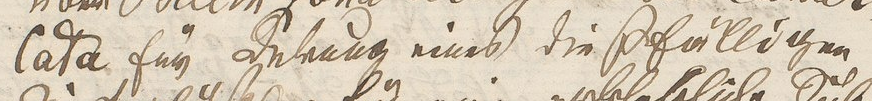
lata für Dekung eines dießfälligen
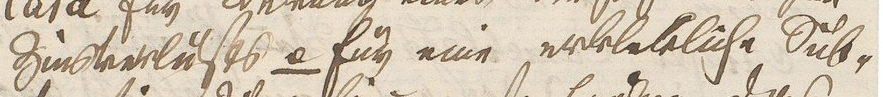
Zinsverlusts & für eine erklekliche Sub-
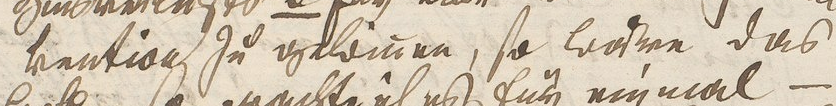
vention zu gewinnen, so wäre das
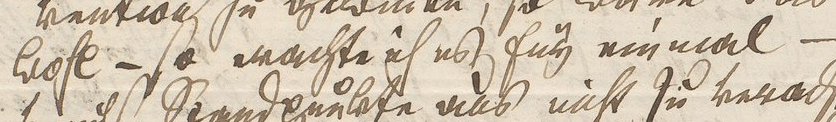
wohl – so erachte ich es für einmal –
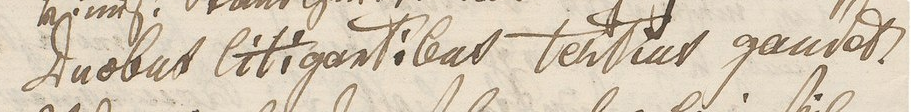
Duobus litigantibus tertius gaudet
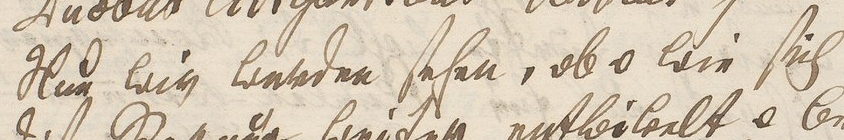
Nun wir werden sehen, ob & wie sich
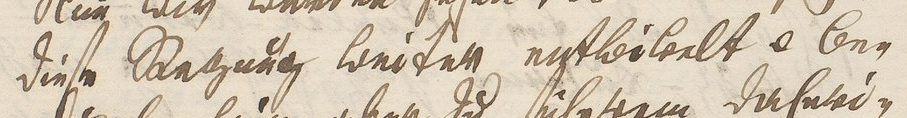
diese Regung weiter entwikelt & be-
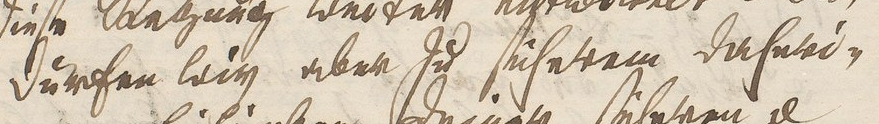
dürfen wir aber zu sicherem daheri-
